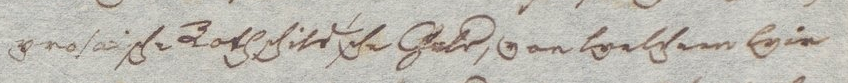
prosaische Rothschild'sche Geld, von welchem wir
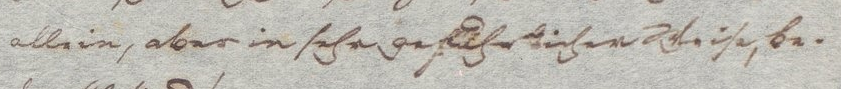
allein, aber in sehr gefährlicher Weise, be-
